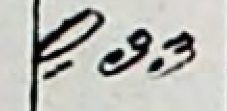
0,33
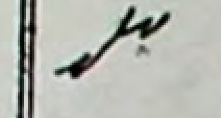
do
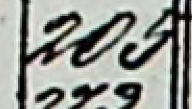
205
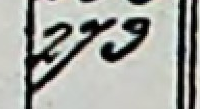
273
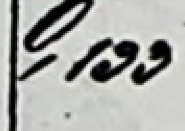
0,133
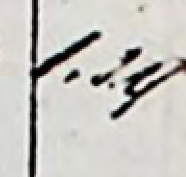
1,39
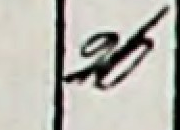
26
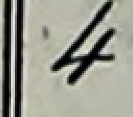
4
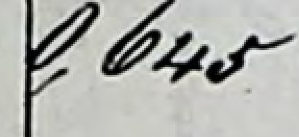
0,645
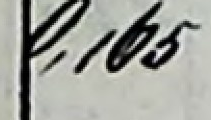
0,165
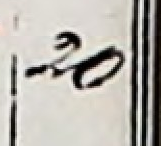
20
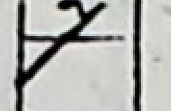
7
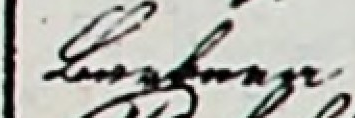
Barbara
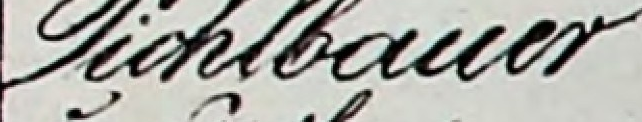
Pichlbauer
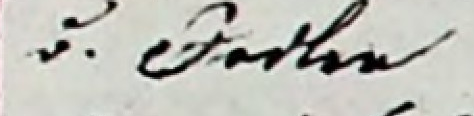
v. Jodler
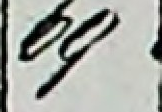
69
